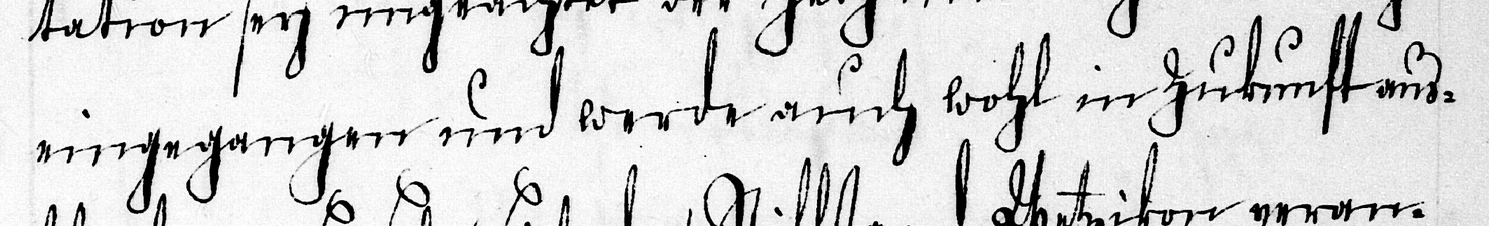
eingegangen und werde auch wohl in Zukunft aus¬
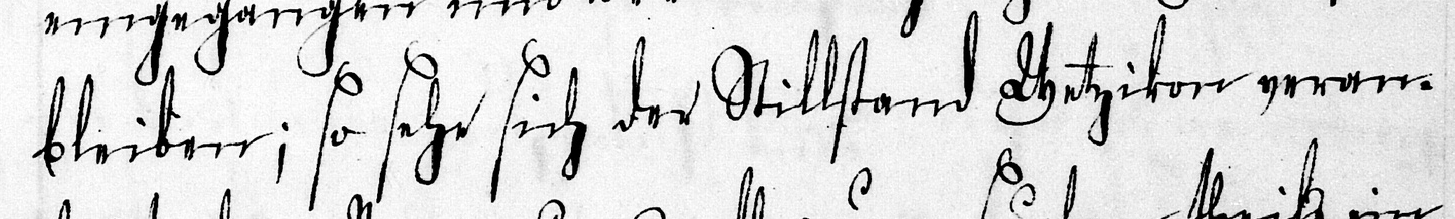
bleiben; so sehe sich der Stillstand Wetzikon veran¬
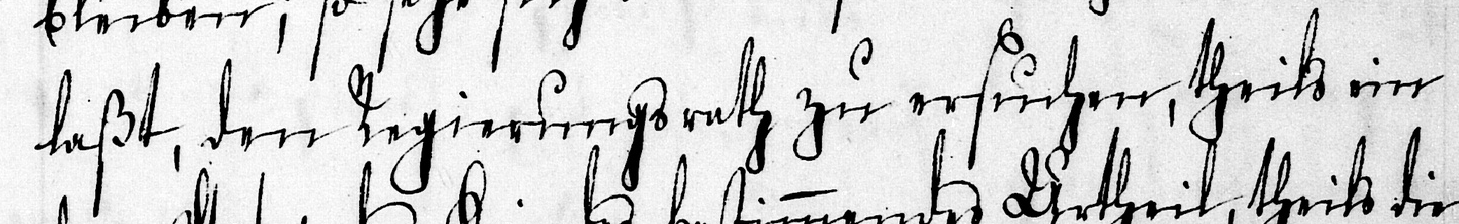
laßt, den Regierungsrath zu ersuchen, theils ein
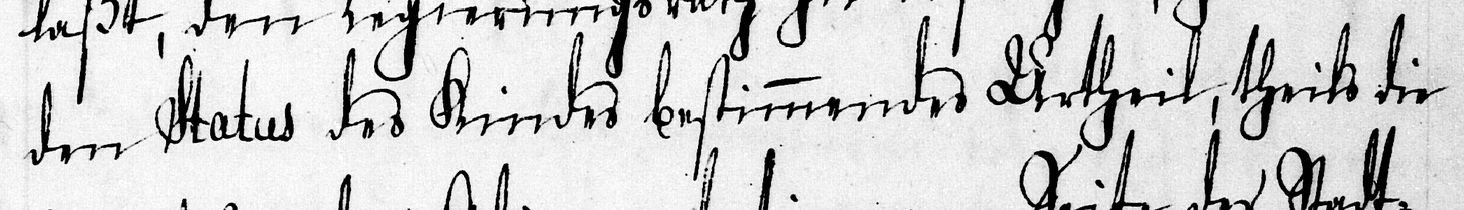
den Status des Kindes bestimmendes Urtheil, theils die
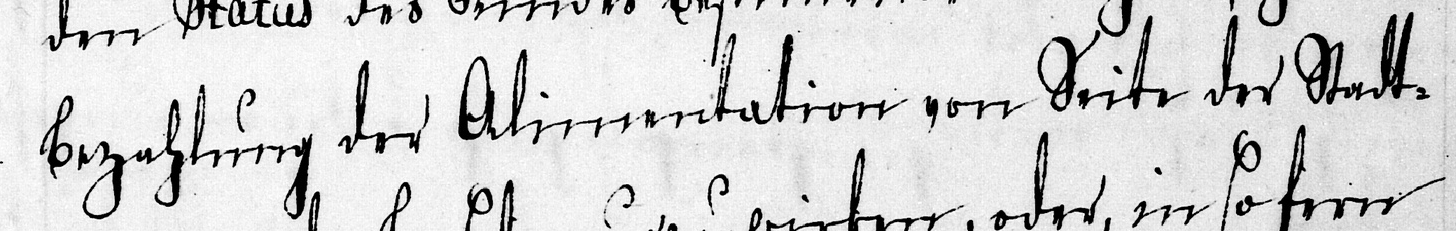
Bezahlung der Alimentation von Seite der Stadt¬
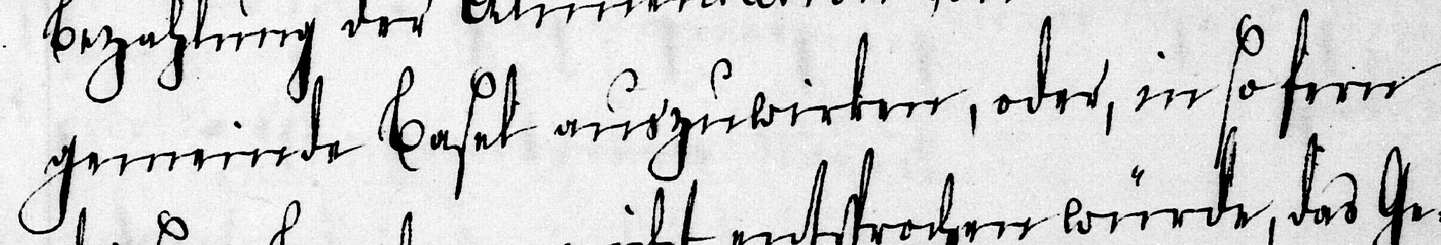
gemeinde Basel auszuwirken, oder, in sofern
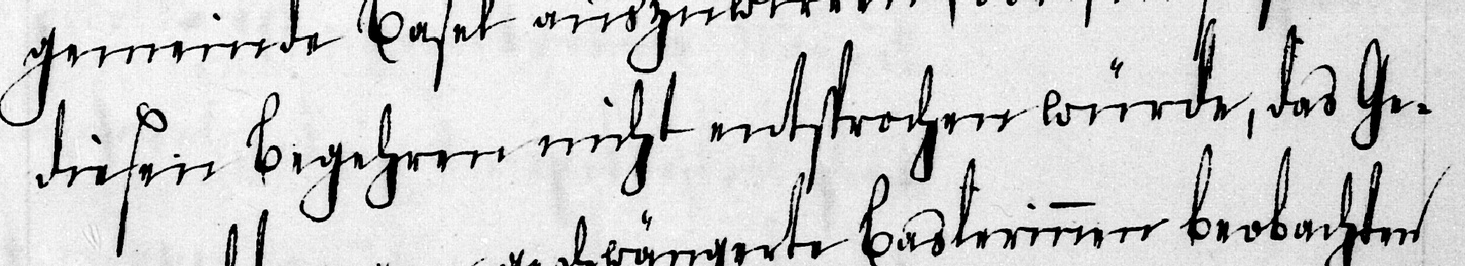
diesen Begehren nicht entsprochen würde, das Ge¬
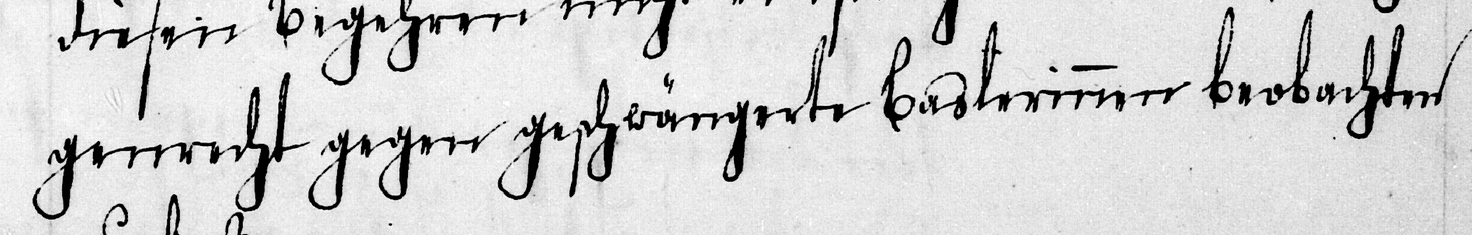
genrecht gegen geschwängerte Baslerinnen beobachten
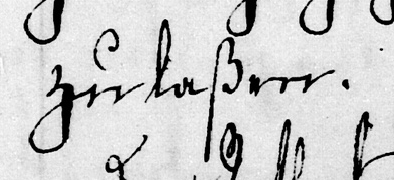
zu laßen.
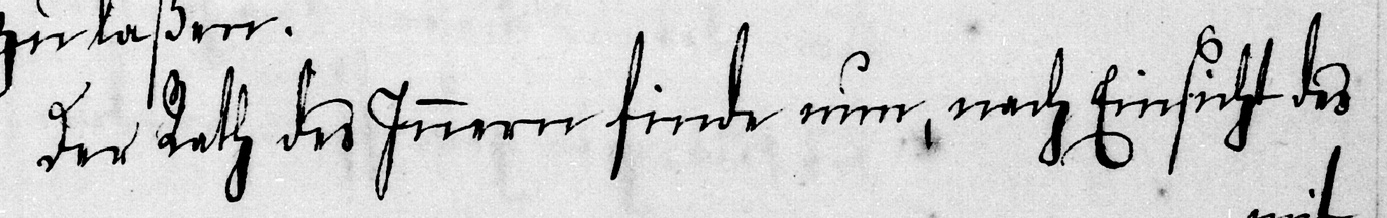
Der Rath des Innern finde nun, nach Einsicht des
